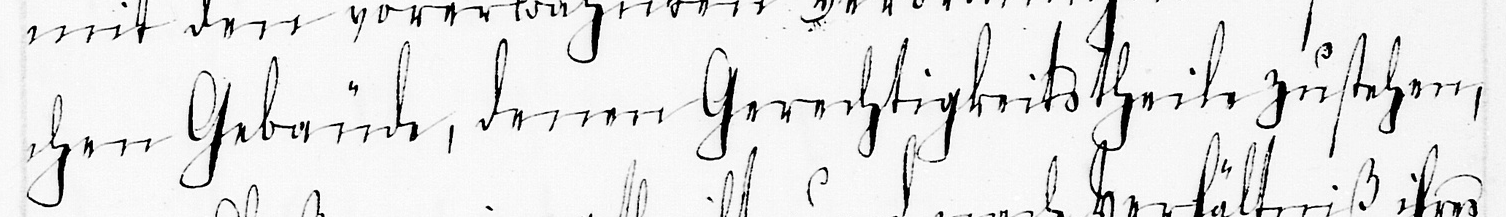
chen Gebäude, denen Gerechtigkeitstheile zustehen,
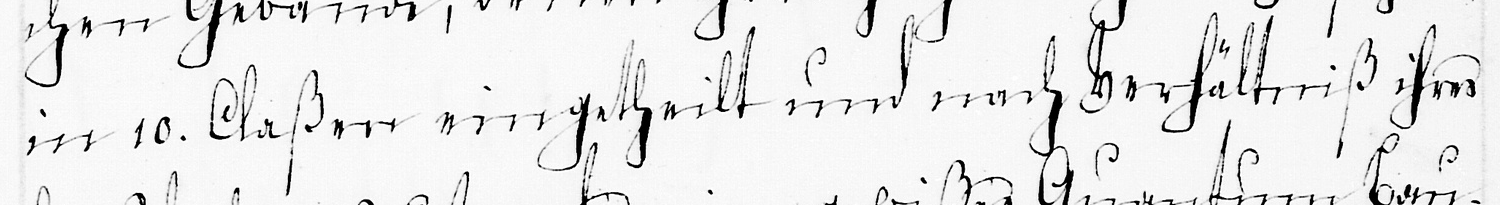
in 10. Claßen eingetheilt und nach Verhältniß ihres
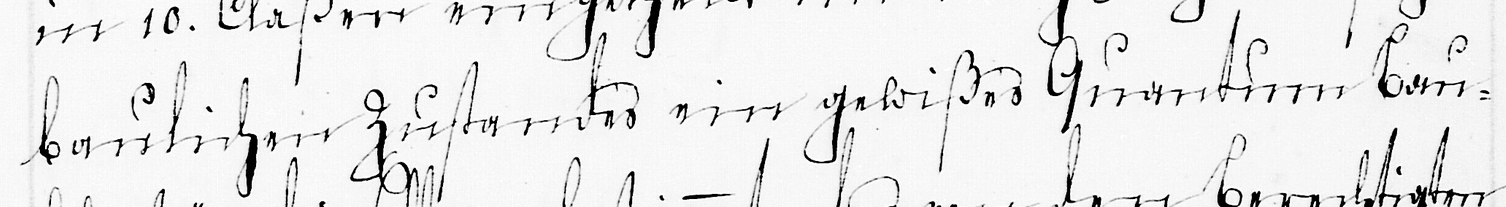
baulichen Zustandes ein gewißes Quantum Bau¬
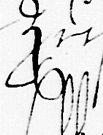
7.
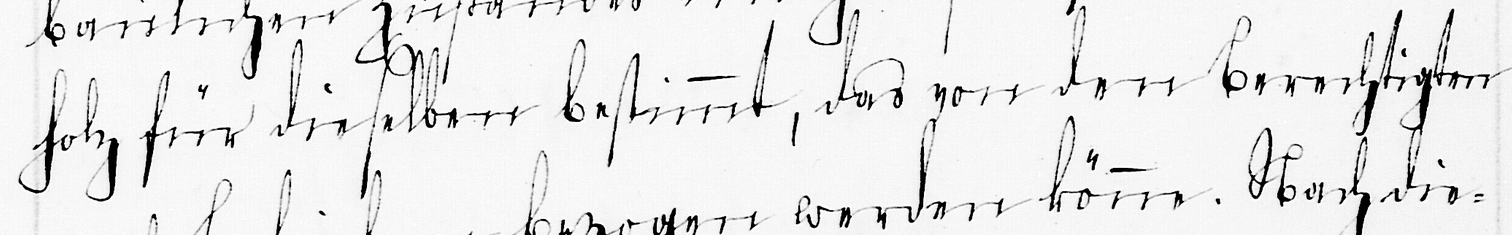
holz für dieselben bestimmt, das von den Berechtigten
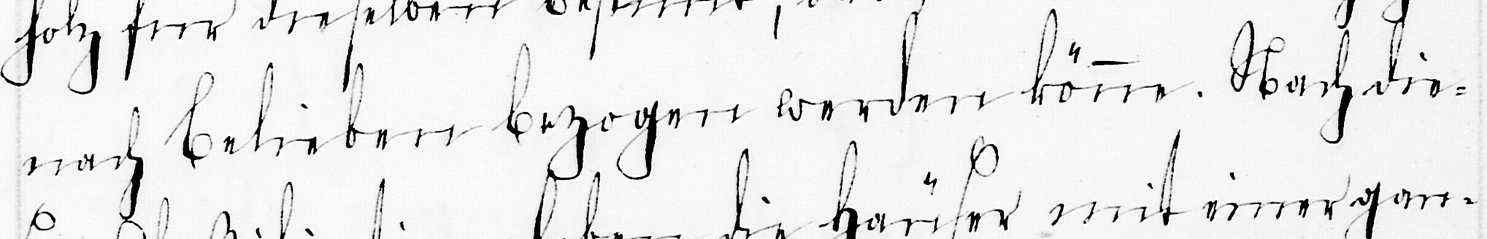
nach Belieben bezogen werden könne. Nach die¬
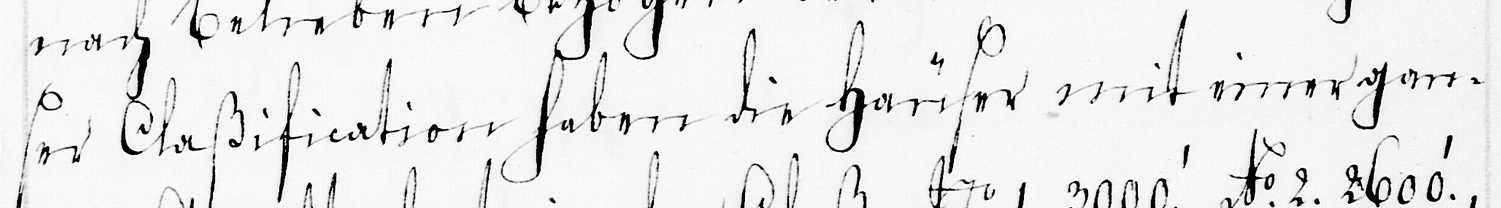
ser Claßification haben die Häuser mit einer gan¬
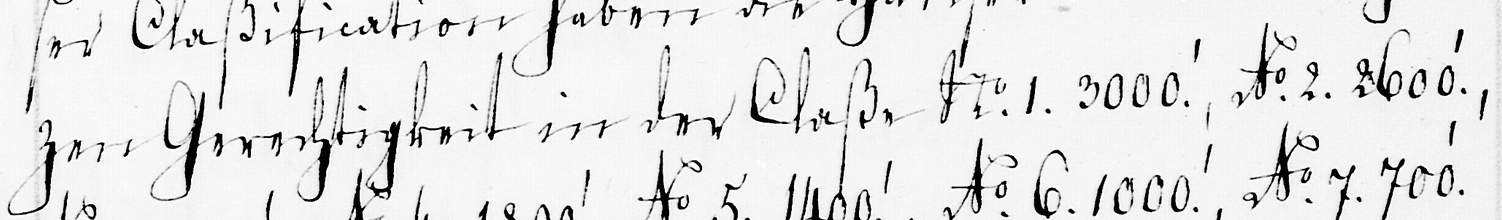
zen Gerechtigkeit in der Claße No. 1. 3000.‘, No. 2.
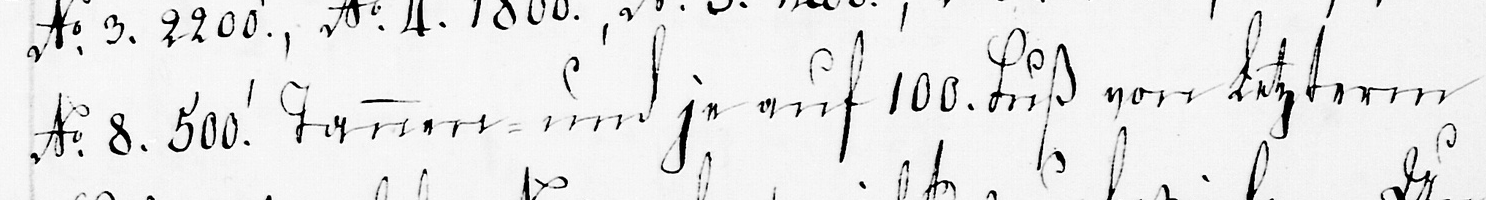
No. 8. 500.‘ Tannen- und je auf 100. Fuß von Letzterm
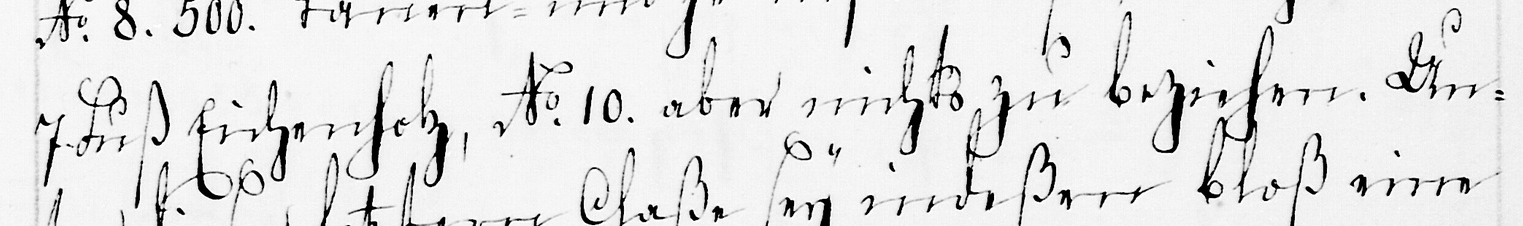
Fuß Eichenholz, No. 10. aber nichts zu beziehen. Un¬
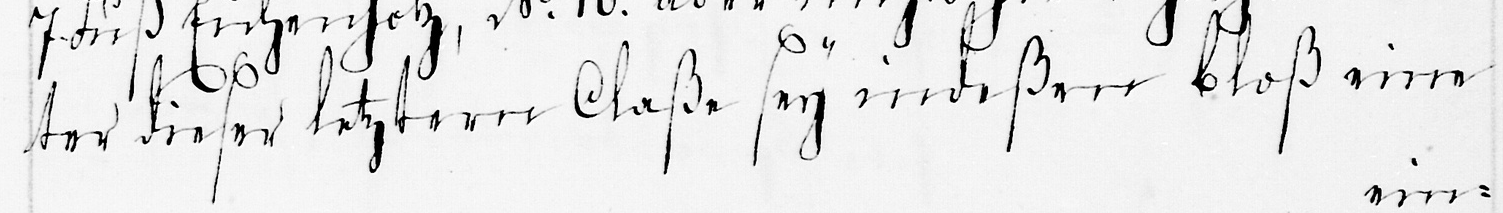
ter dieser letztern Claße sey indeßen bloß eine
